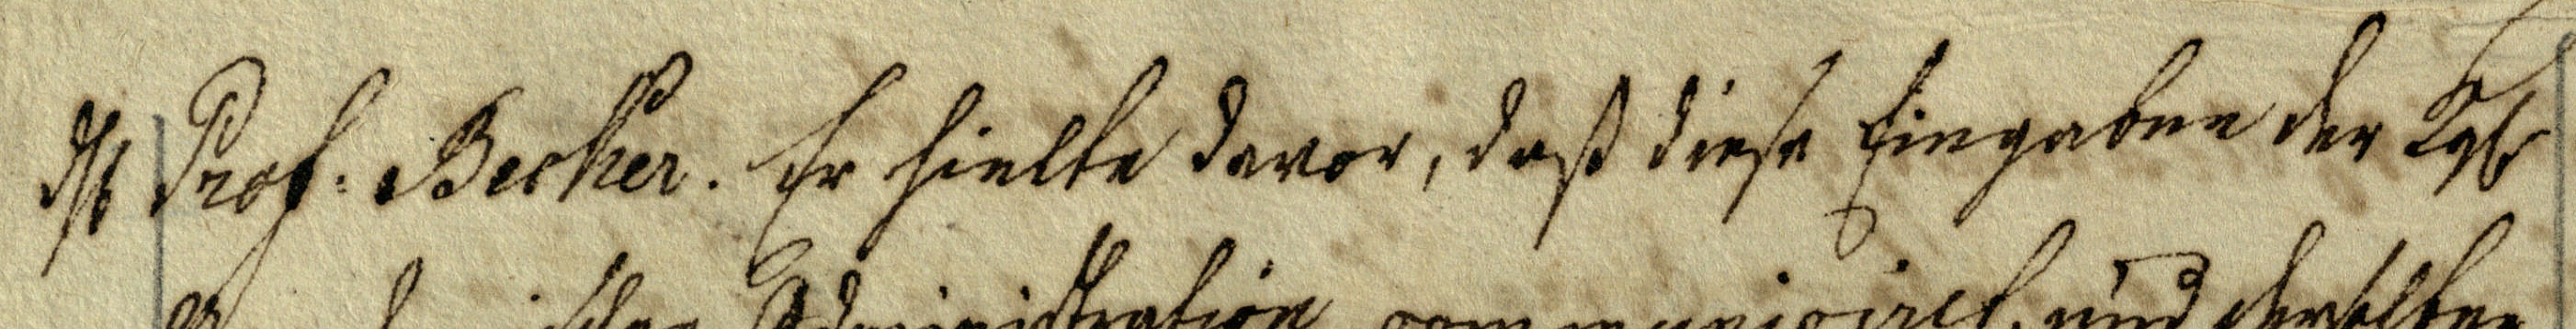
dh Prof. Becker. Er hielte davor, daß diese Eingabe der Kgl.
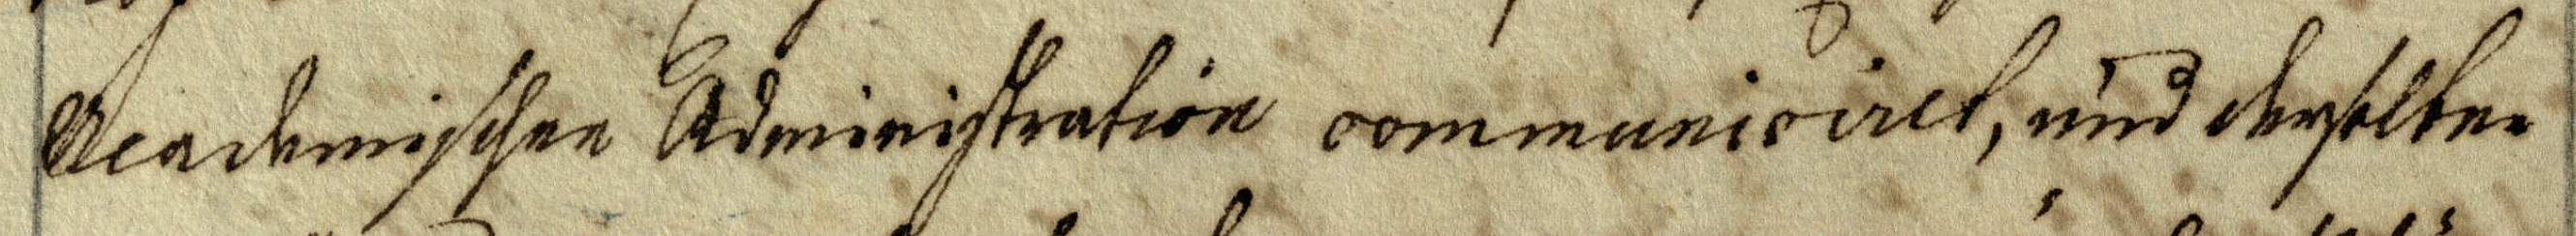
Academischen Administration communiciret, und derselben
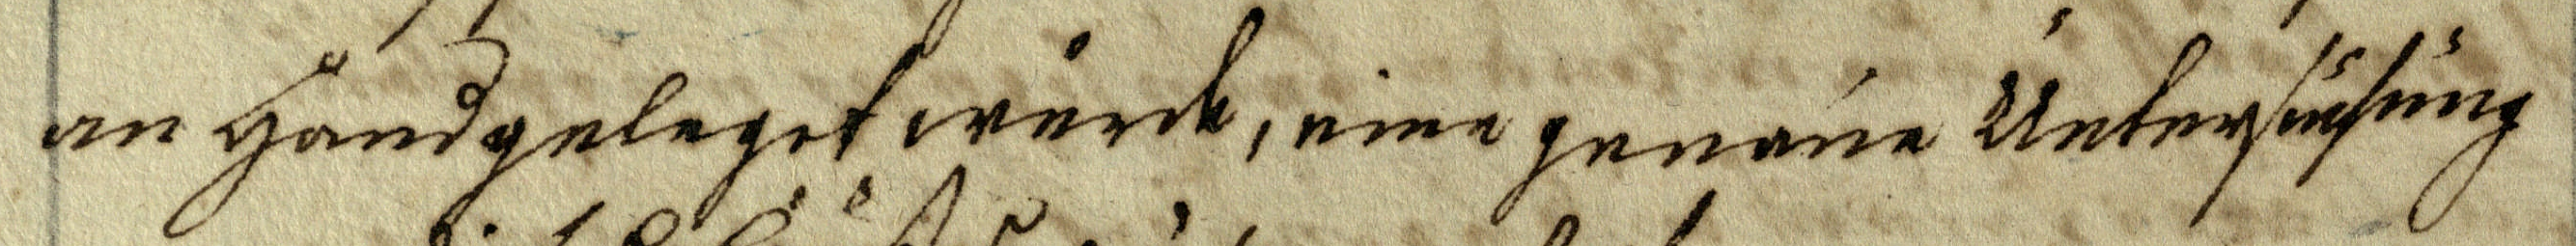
an Hand geleget würde, eine genaue Untersuchung
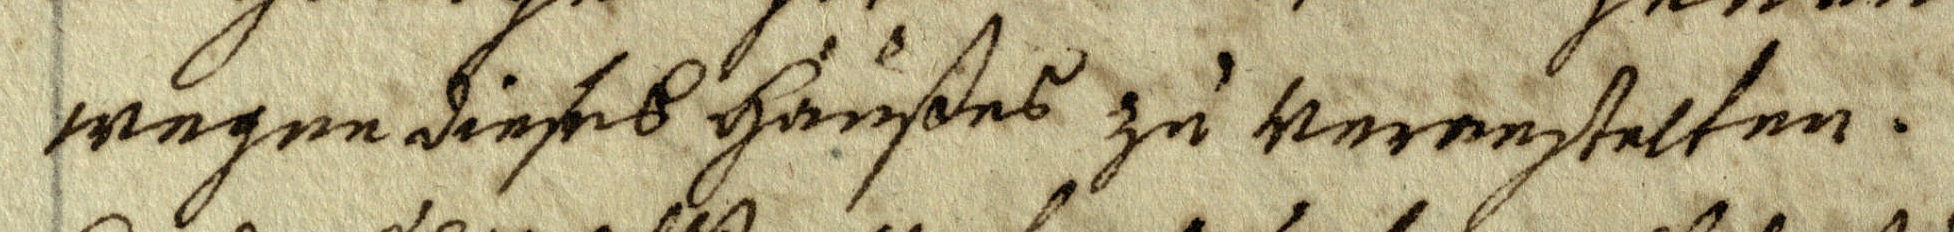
wegen dieses Haußes zu veranstalten.
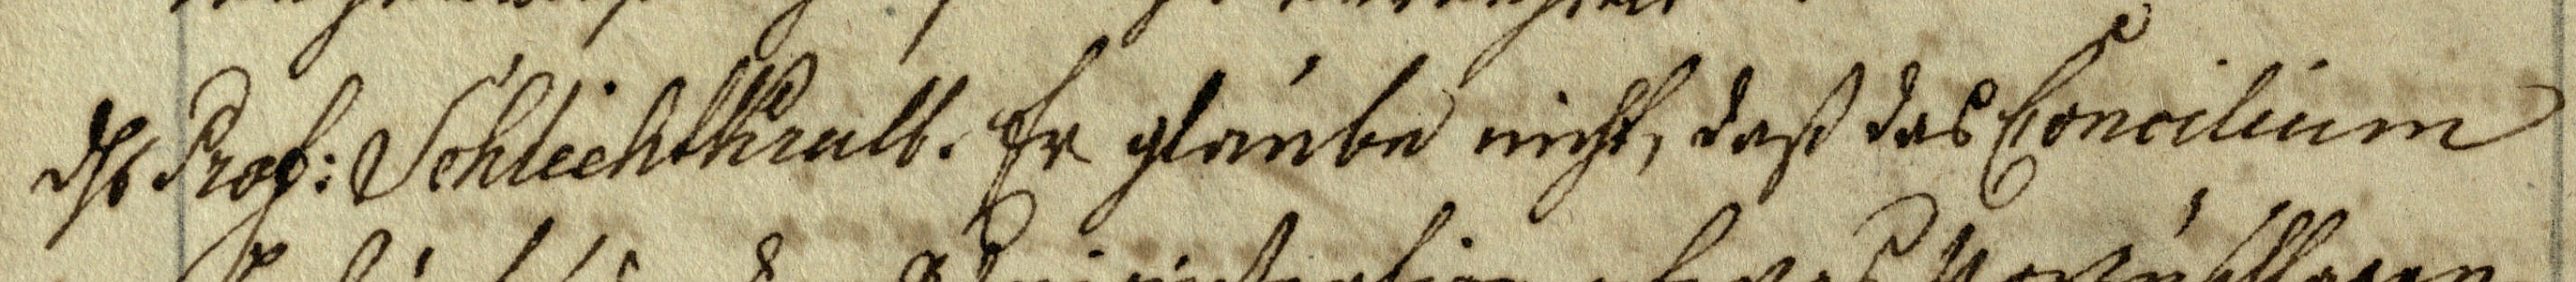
dh Prof. Schlichtkrull. Er glaube nicht, daß das Concilium
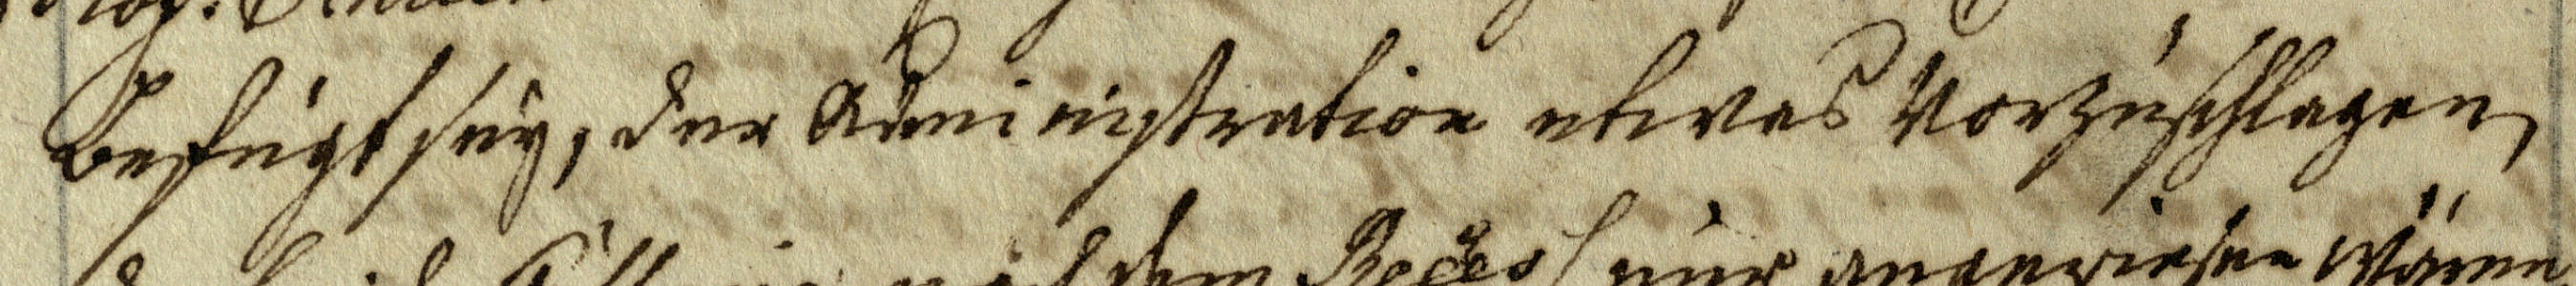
befugt seÿ, der Administration etwas vorzuschlagen,
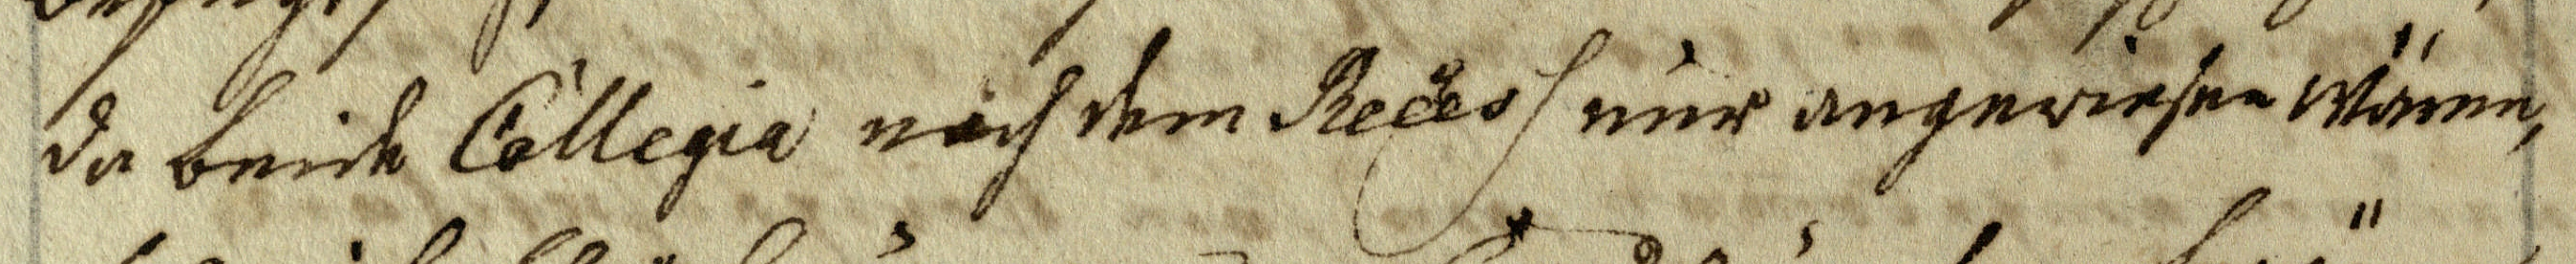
da beide Collegia nach dem Recess nur angewiesen wären,
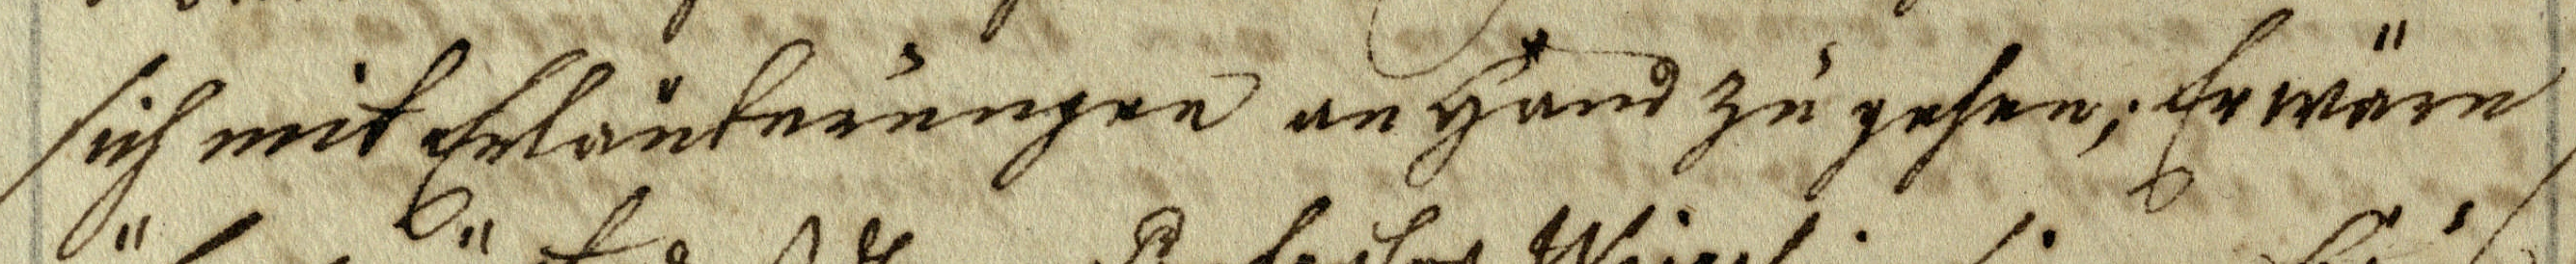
sich mit Erläuterungen an Hand zu gehen; Er wäre
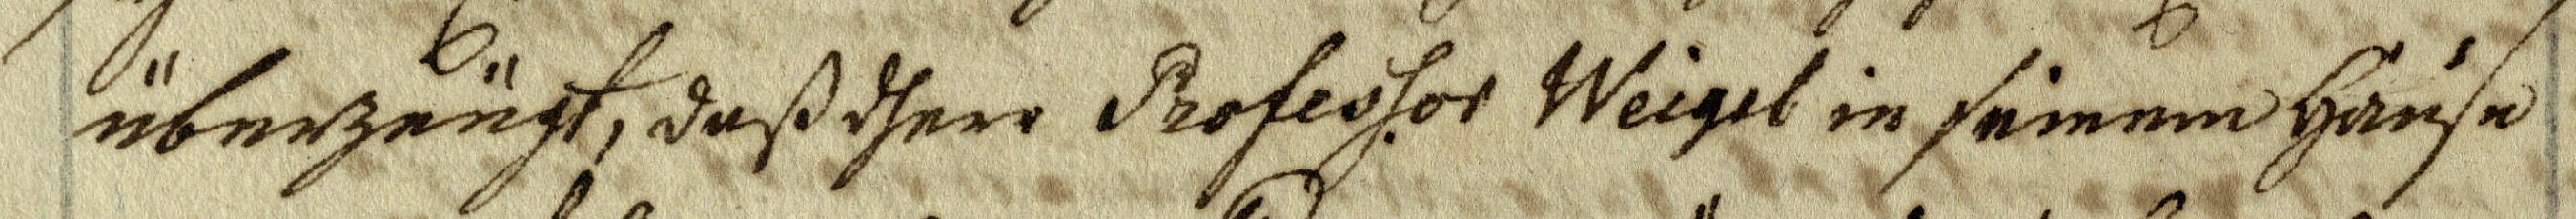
überzeugt, daß dherr Professor Weigel in seinem Hause
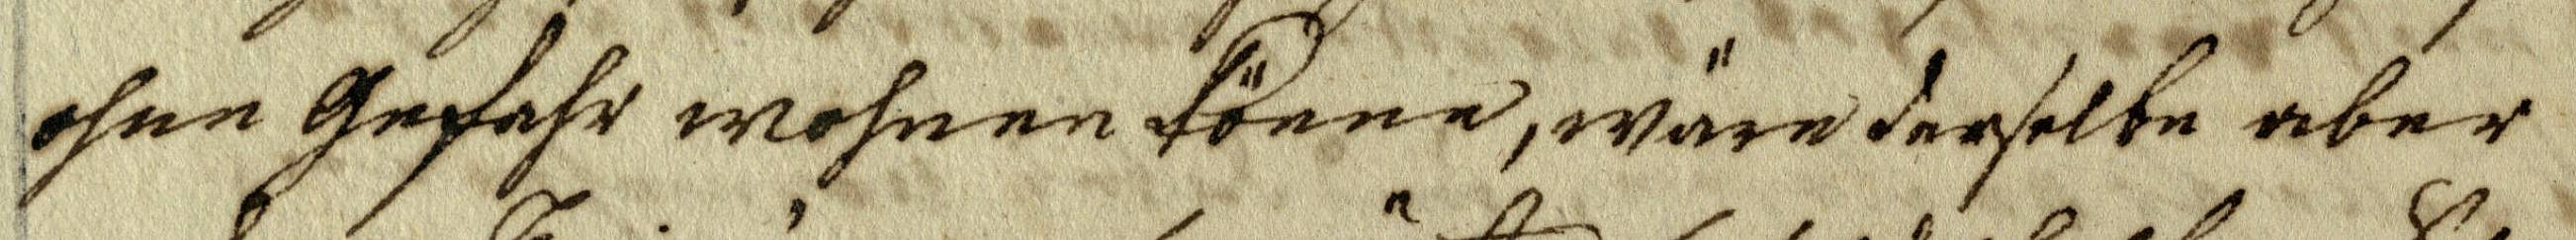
ohne Gefahr wohnen könne, wäre derselbe aber
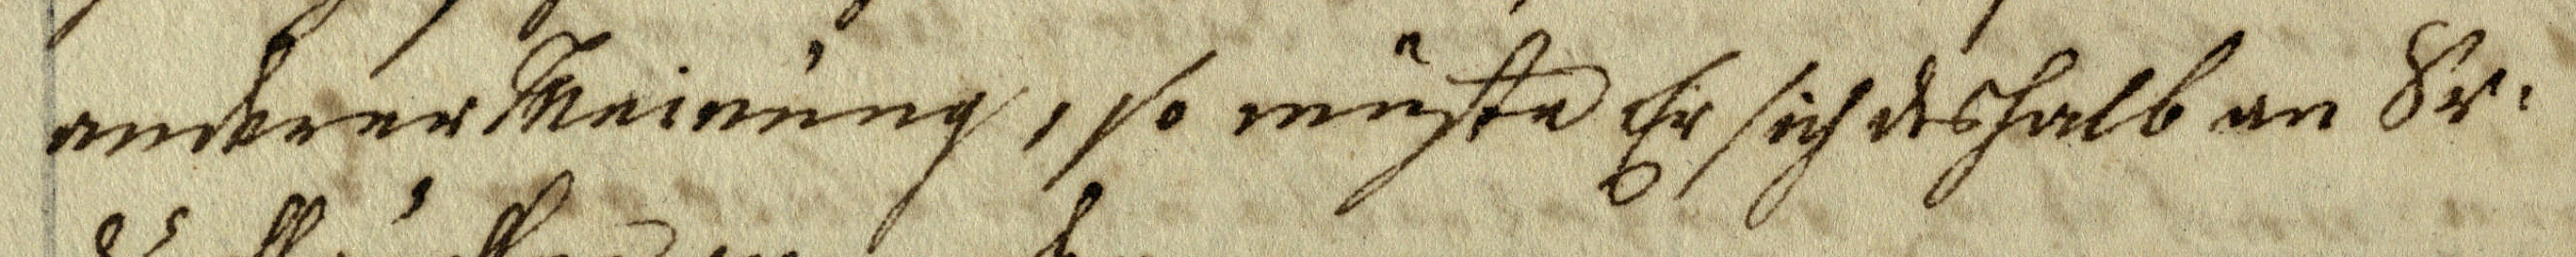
anderer Meinung, so müßte Er sich deshalb an Sr
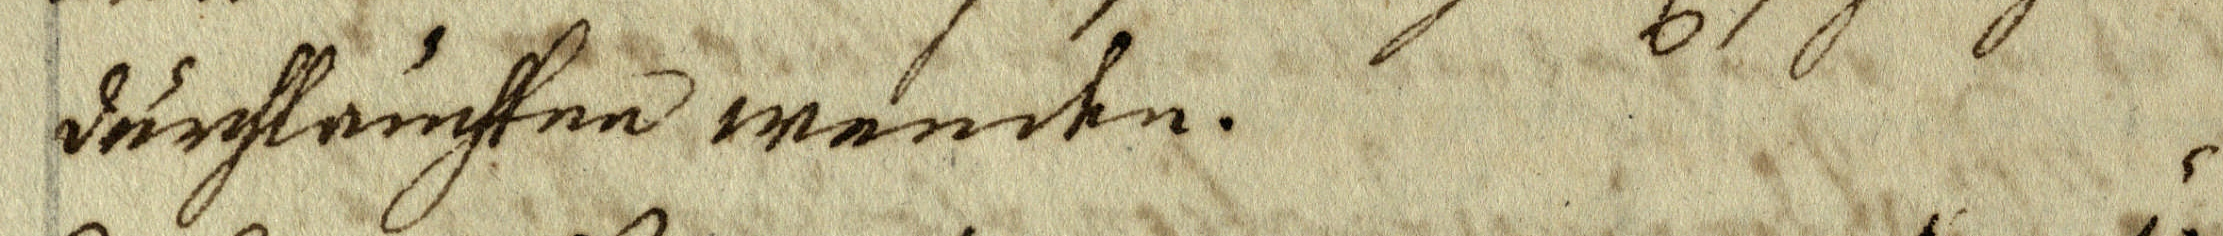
Durchlauchten wenden.
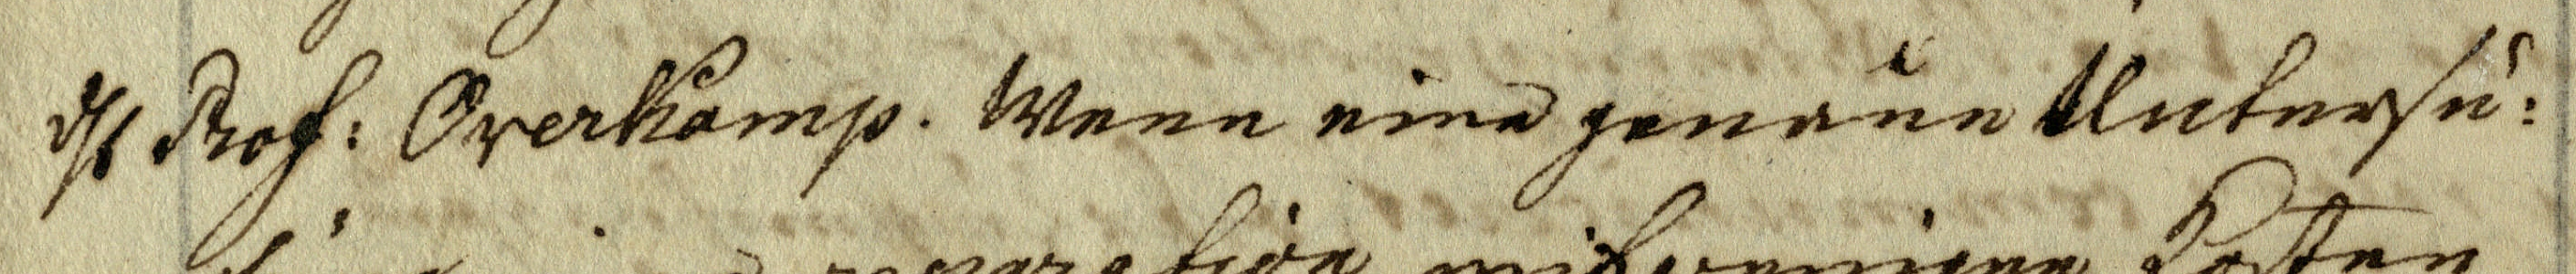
dh Prof. Overkamp. Wenn eine genaue Untersu¬
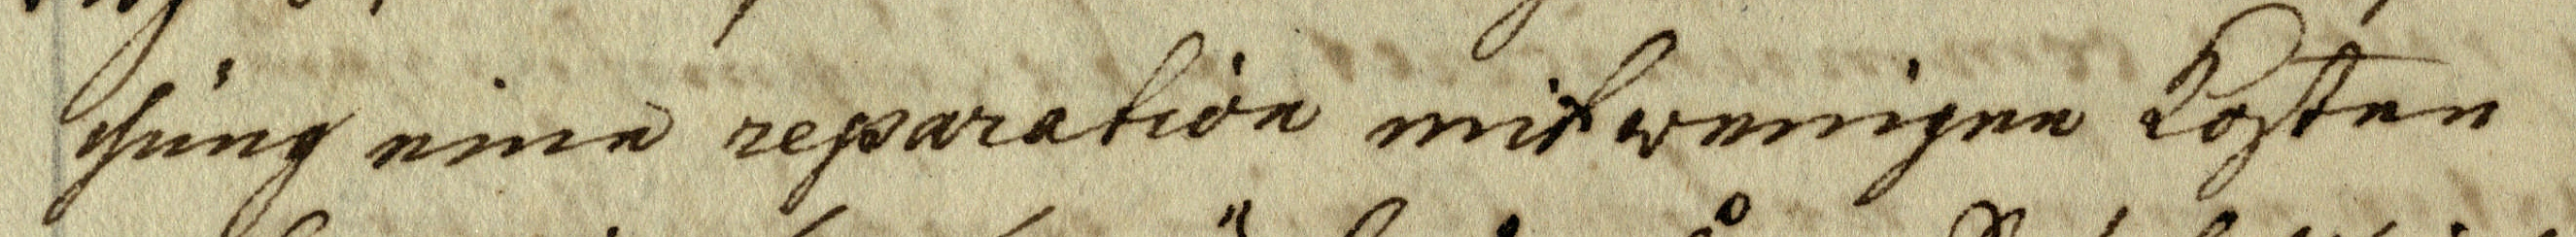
chung eine reparation mit wenigen Kosten
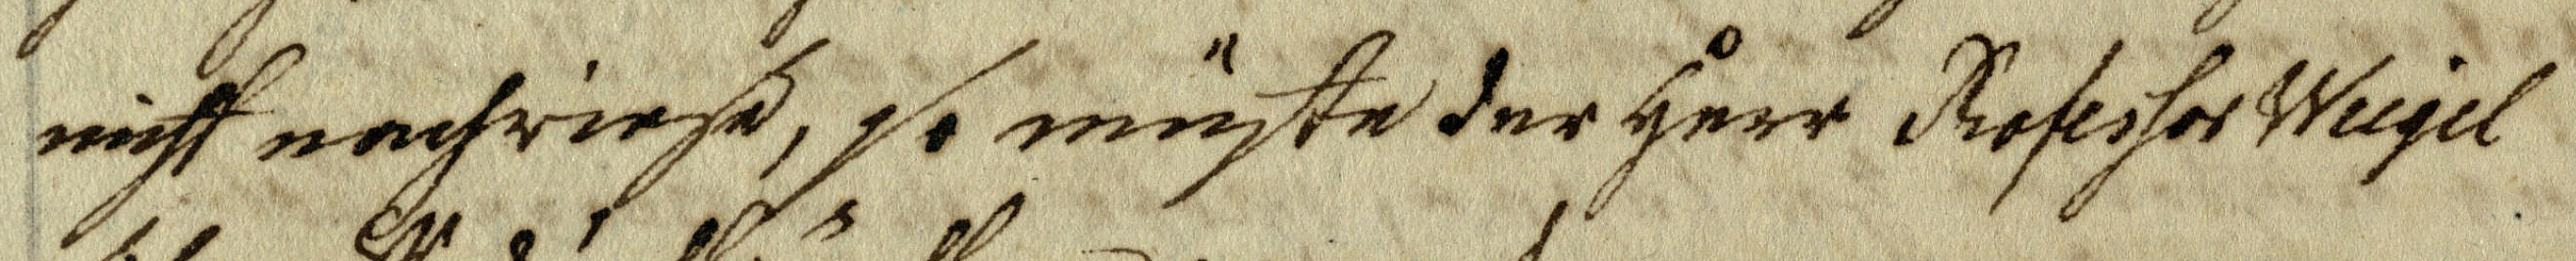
nicht nachwiese, so müßte der Herr Professor Weigel
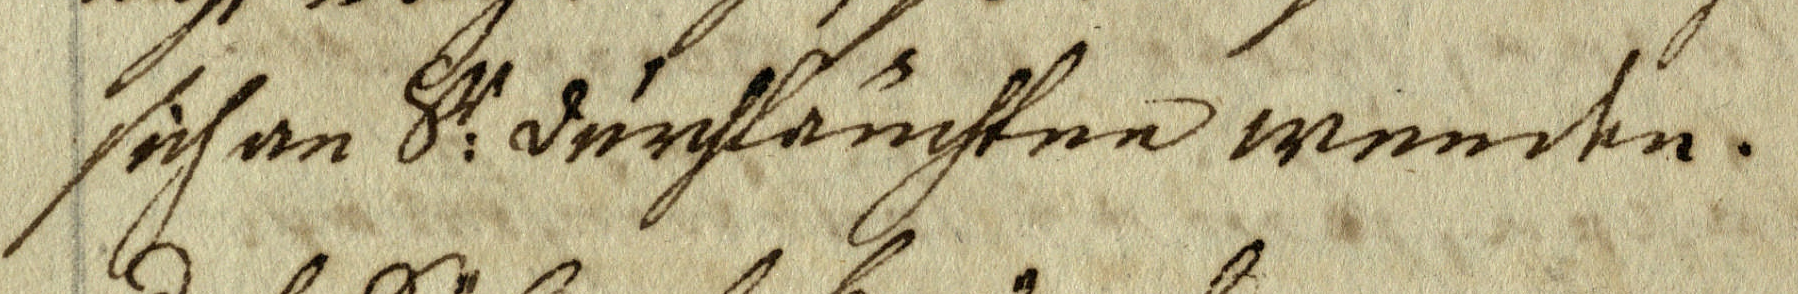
sich an Sr Durchlauchten wenden.
